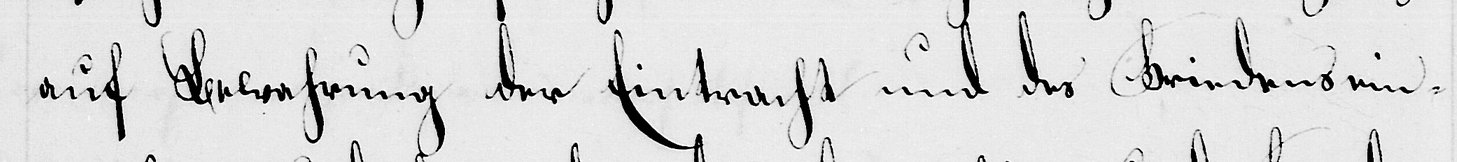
auf Bewahrung der Eintracht und des Friedens ein¬
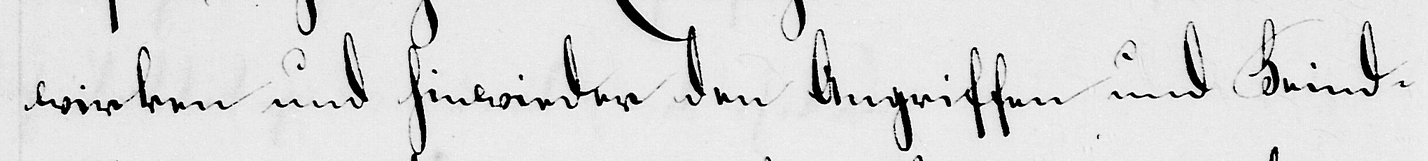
wirken und hinwieder den Angriffen und Feind¬
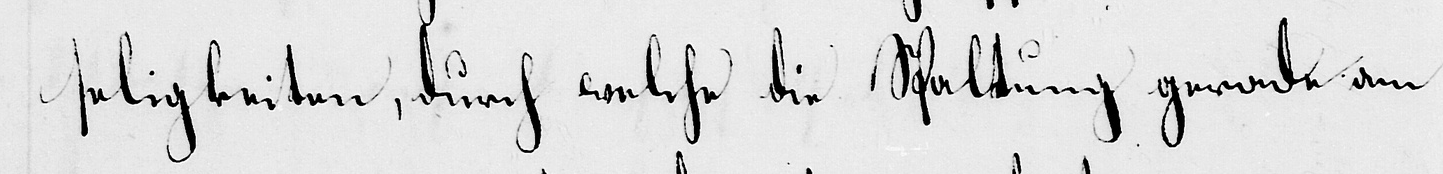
seligkeiten, durch welche die Spaltung gerade am
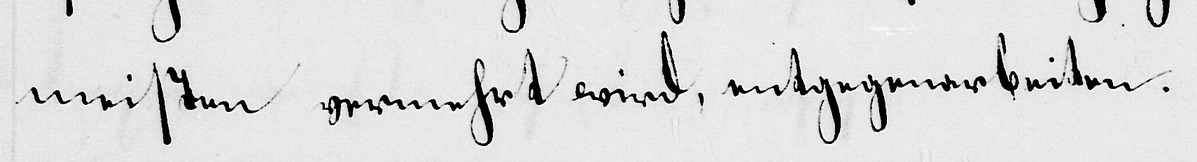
meisten vermehrt wird, entgegenarbeiten.
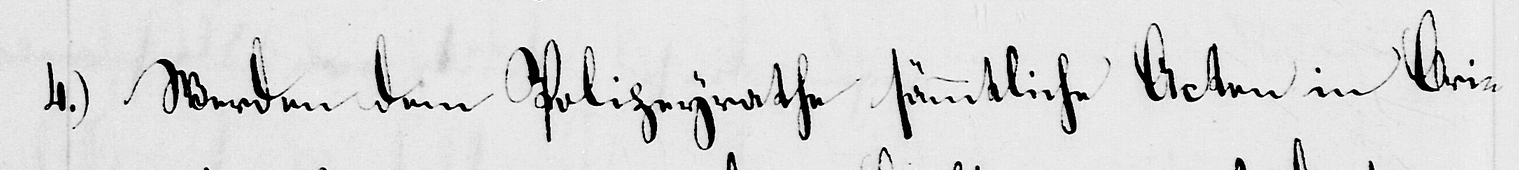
4.) Werden dem Polizeyrathe sämmtliche Acten in Ori¬
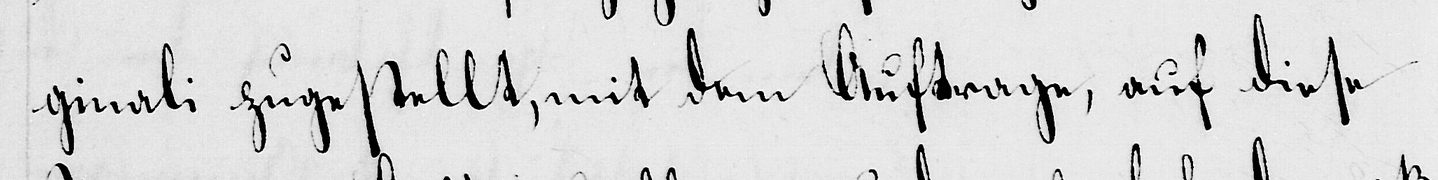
ginali zugestellt, mit dem Auftrage, auf diese
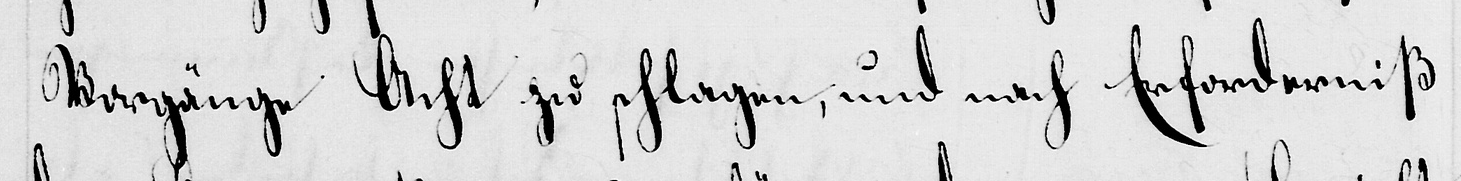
Vorgänge Acht zu schlagen, und nach Erforderniß
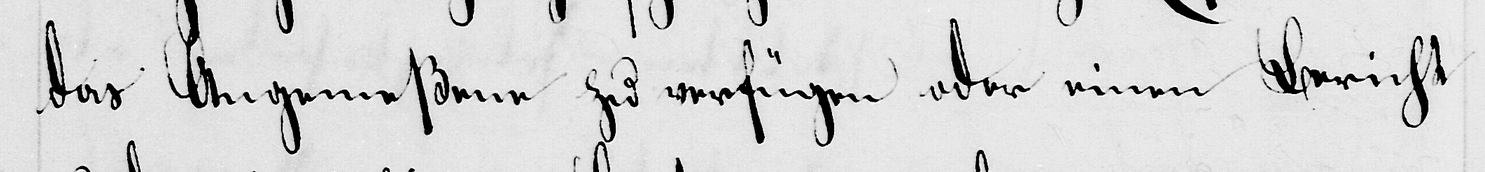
das Angemeßene zu verfügen oder einen Bericht
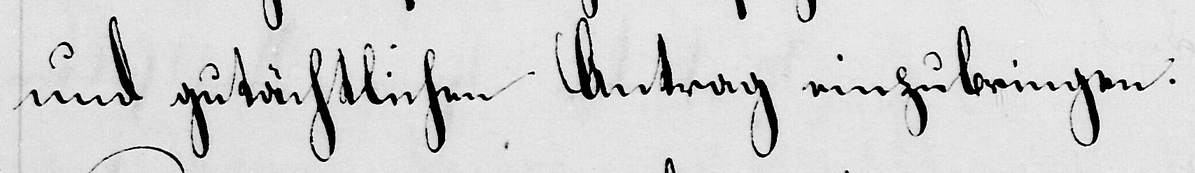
und gutächtlichen Antrag einzubringen.
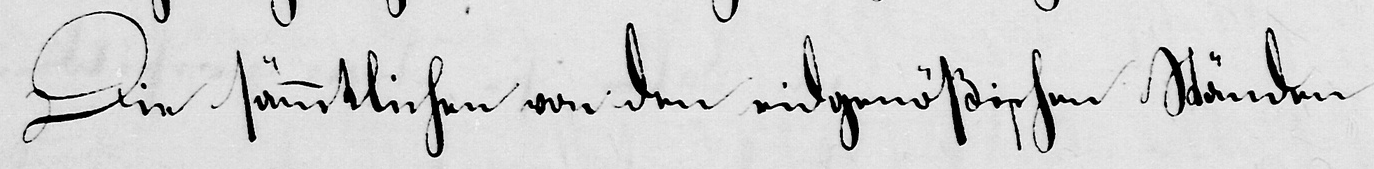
Die sämmtlichen von den eidgenößischen Ständen
